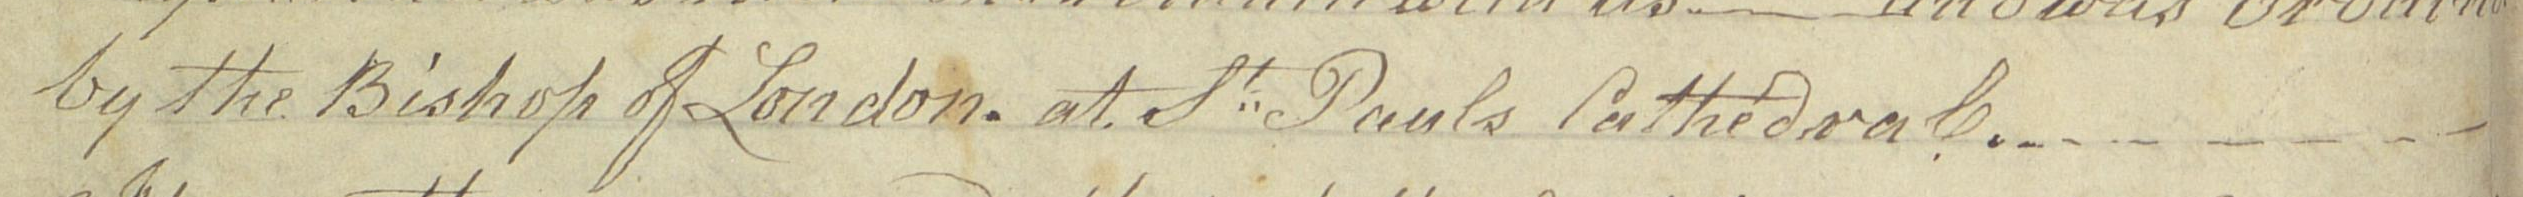by the Bishop of London at S^t. Pauls Cathedral.
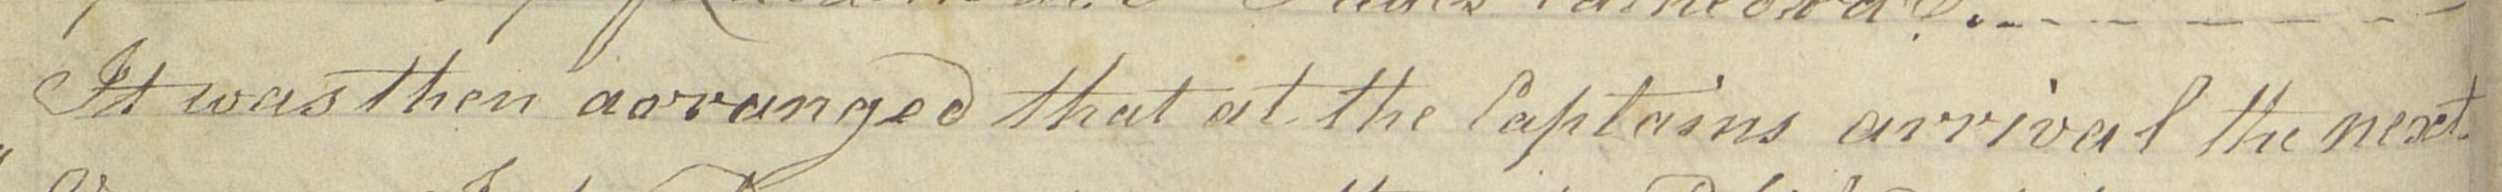It was then arranged that at the Captains arrival the next
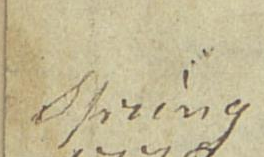Spring
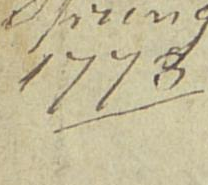1773
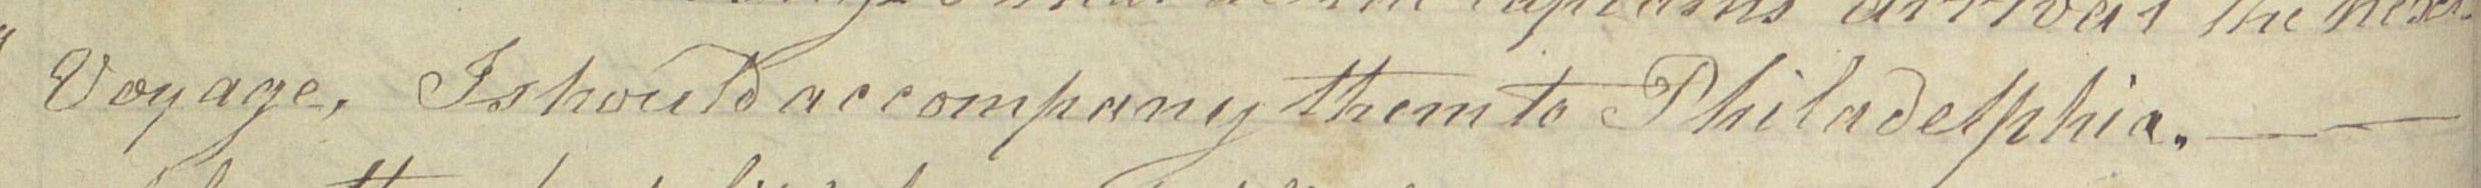Voyage, I should accompany them to Philadelphia.
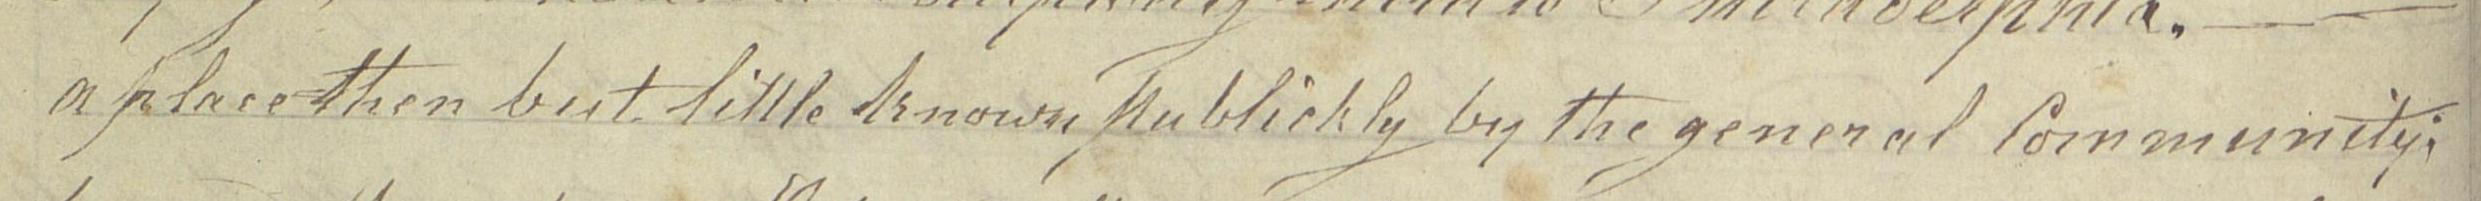a place then but little known publickly by the general Community:
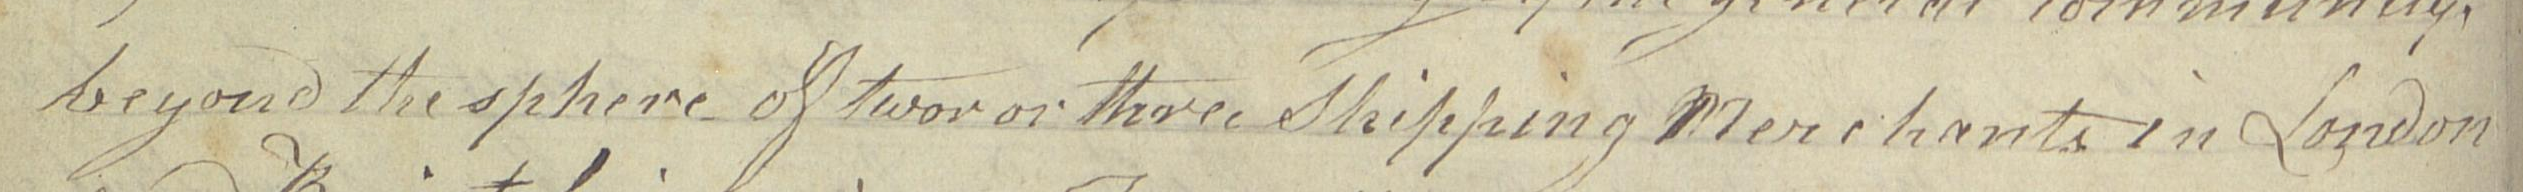beyond the sphere of twor or three Shipping Merchants in London
